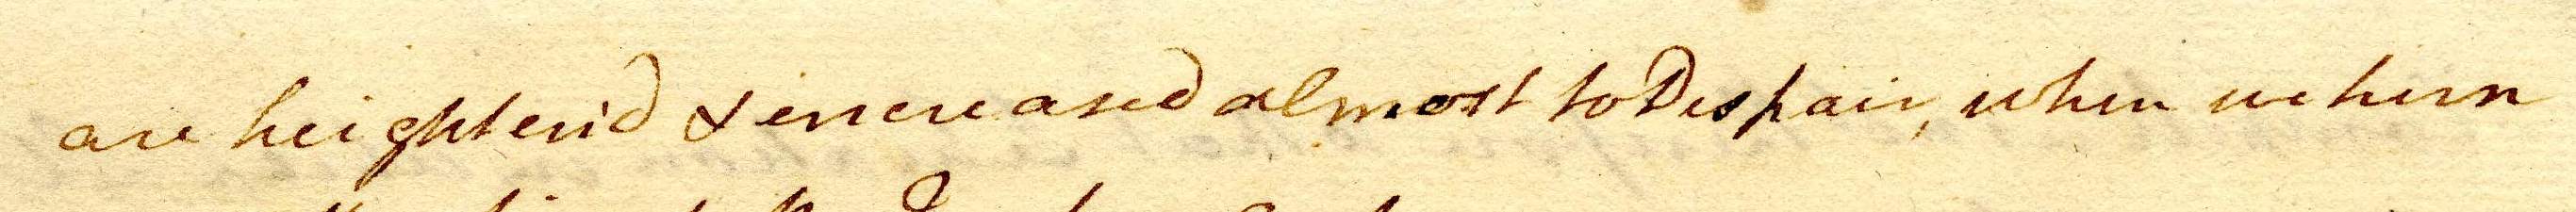are heightened & increased almost to Despair, when we turn
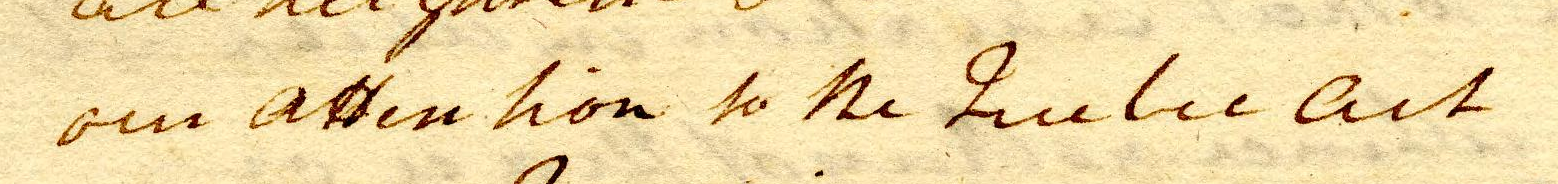our attention to the Twelve Act
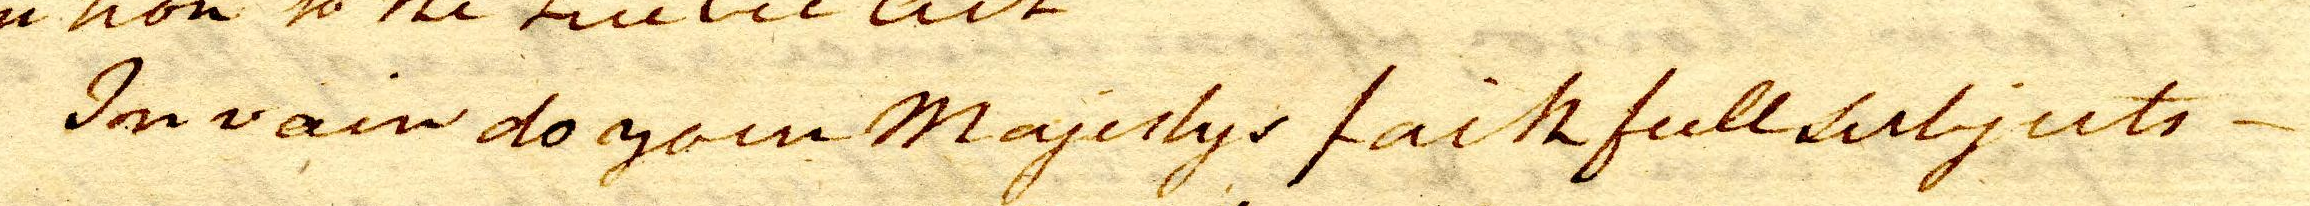In vain do your Majestys faithful subjects-
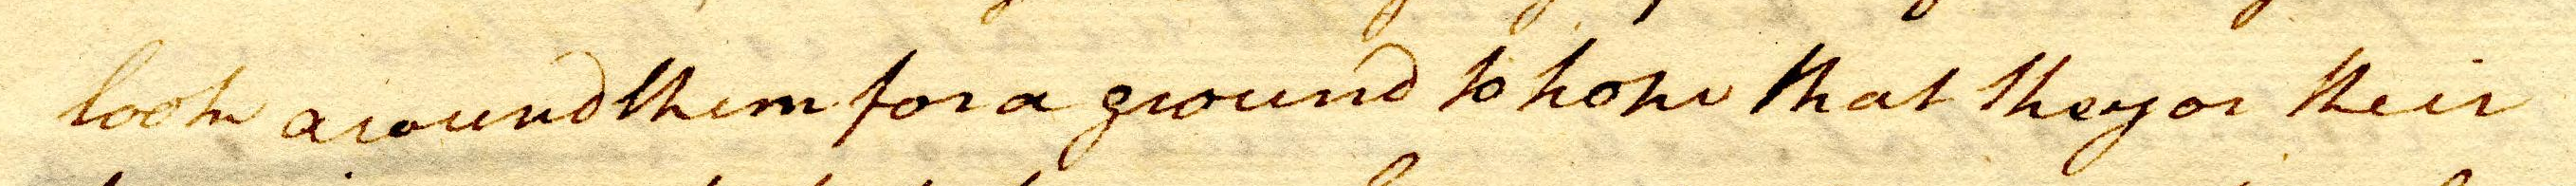look around them for a ground to hope that they or their
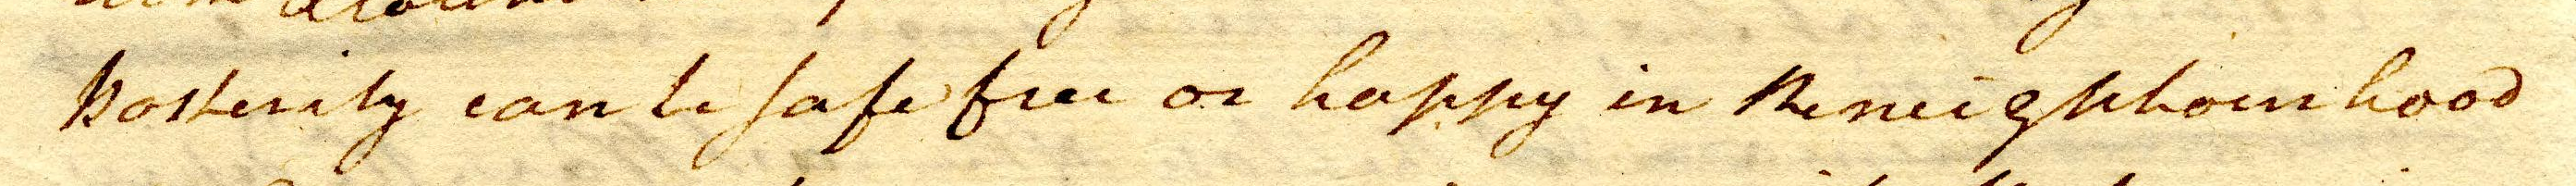posterity can be safe free or happy in the neighbourhood
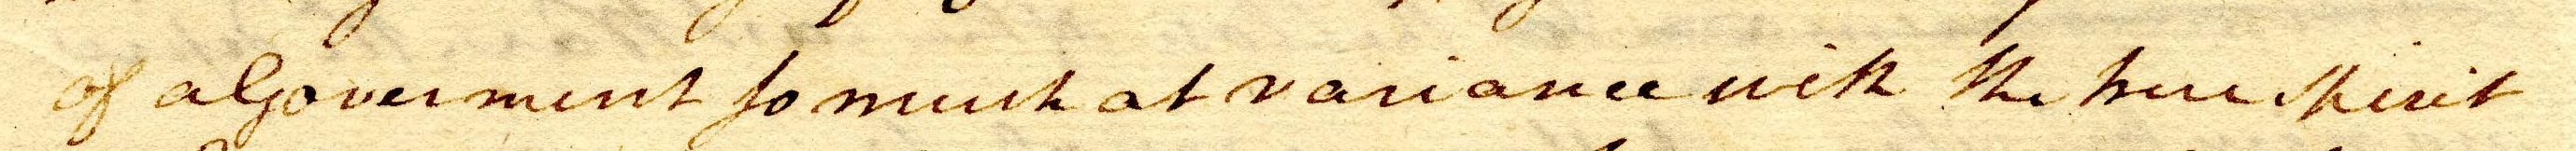of aGoverment so much at variance with the [here] spirt
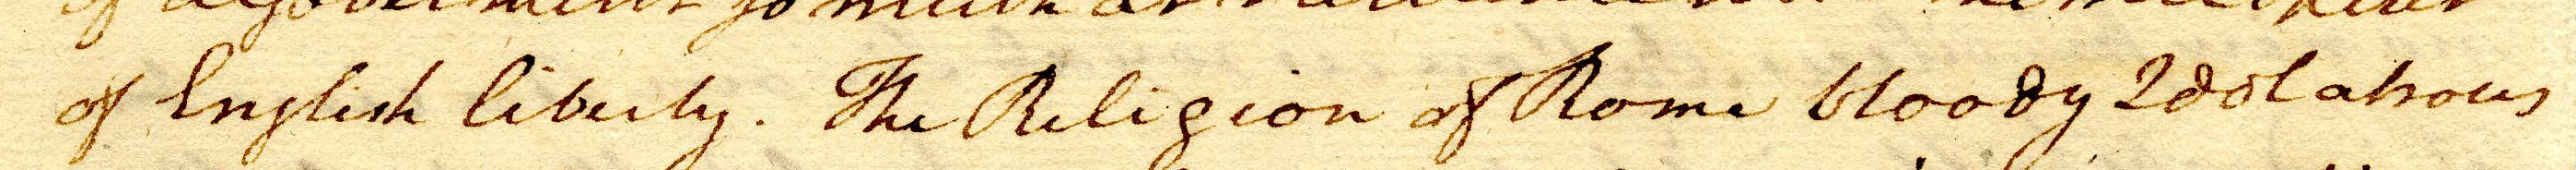of English liberty. The Religion of Rome bloody Idolatrous
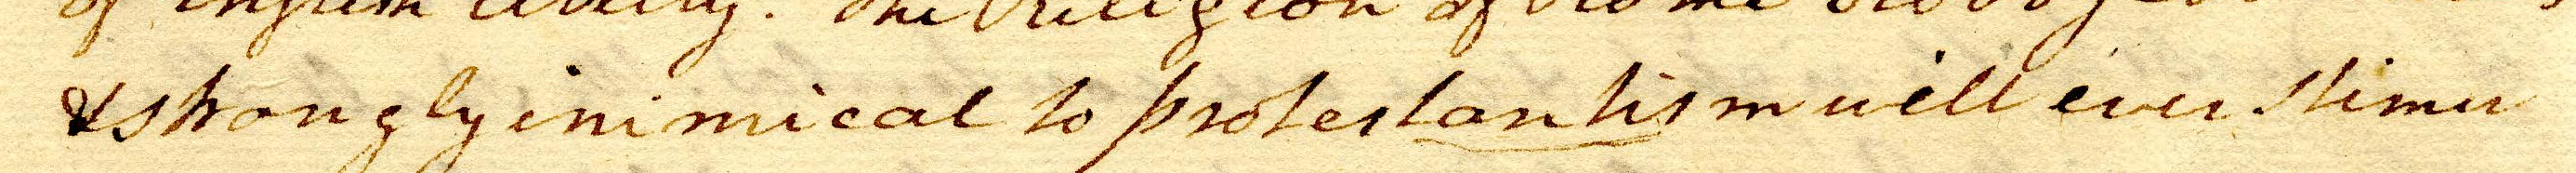& strongly inimical to protestantism will ever stimu
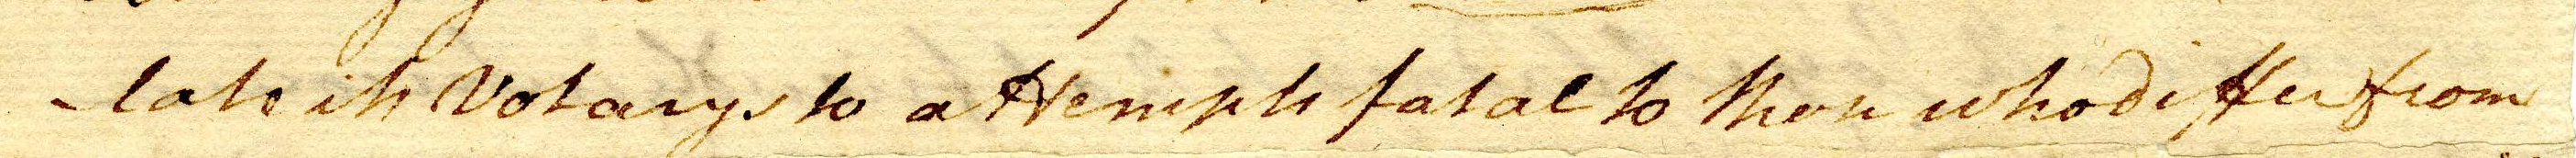-late its Votarys to attempts fatal to those who differ from
